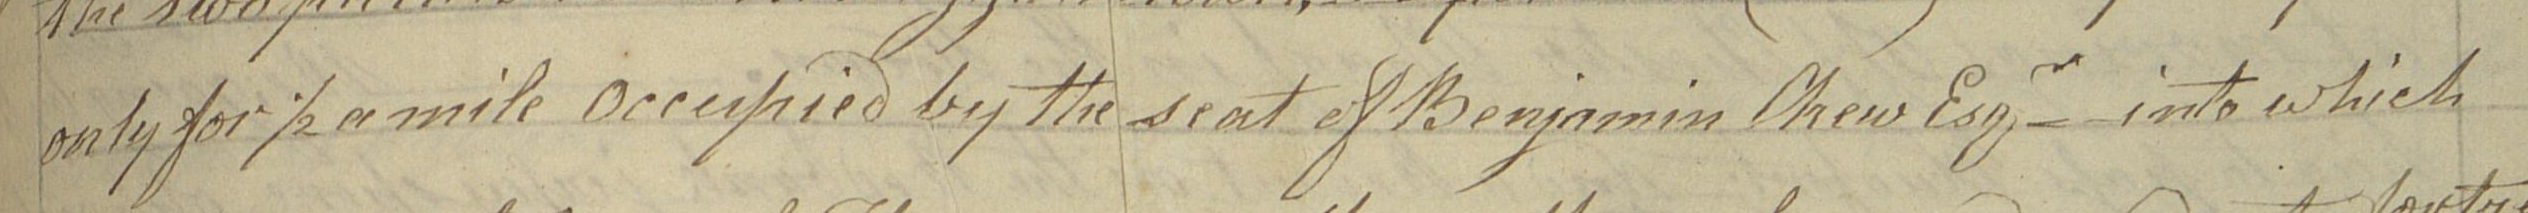only for a mile occupied by the seat of Benjamin Chew Esq^r into which
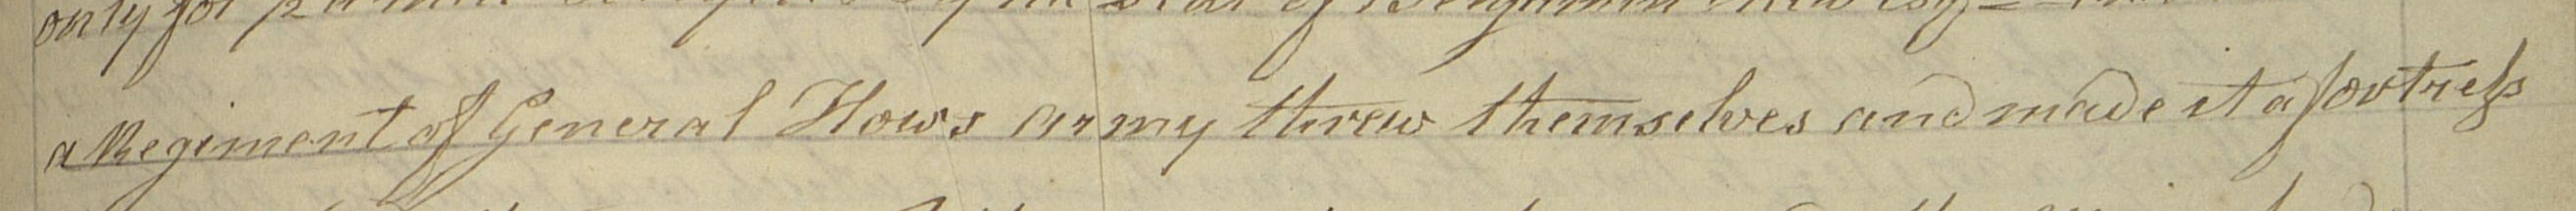a Regiment of General Hows army threw themselves and made it a fortress
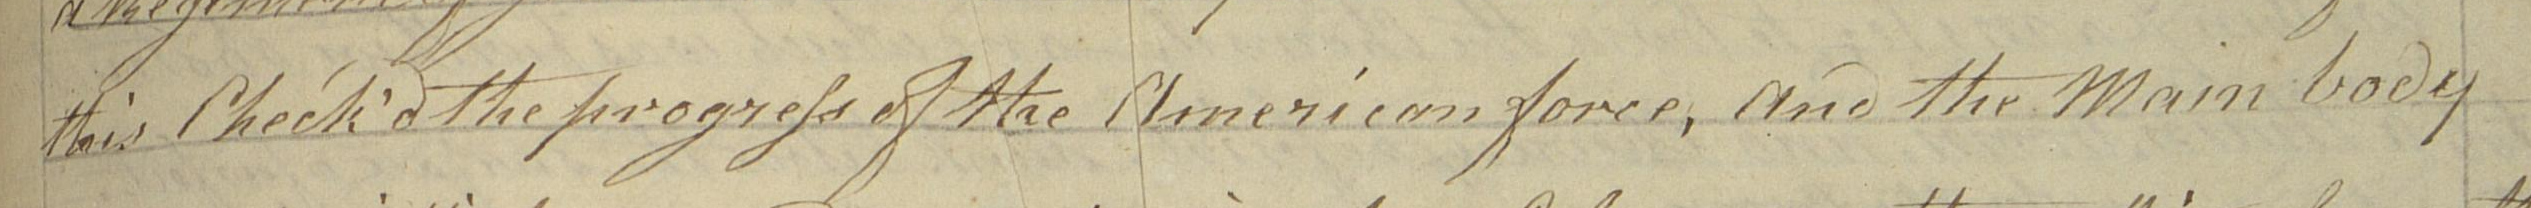this Check'd the progress of the American force, and the Main body
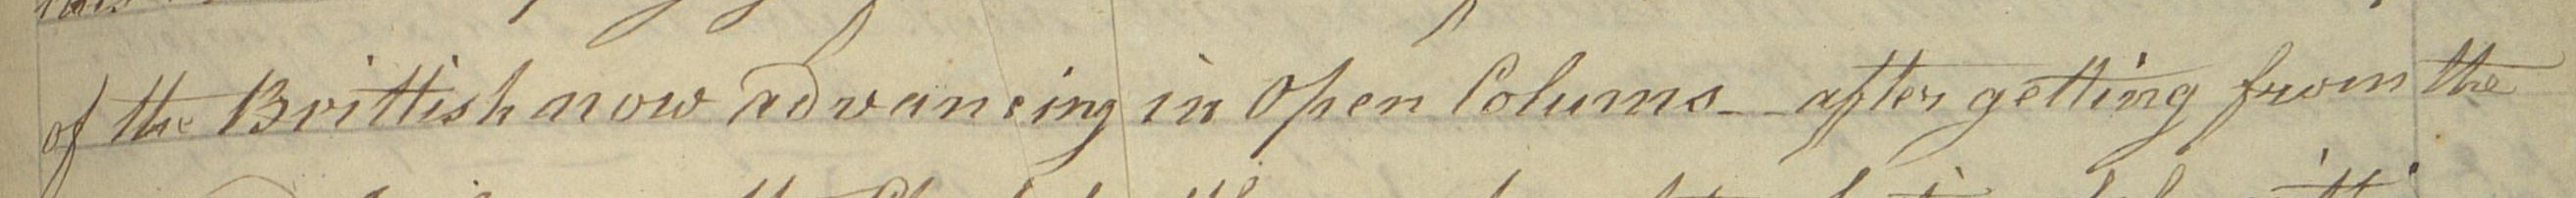of the Brittish now advancing in open Colums, after getting from the
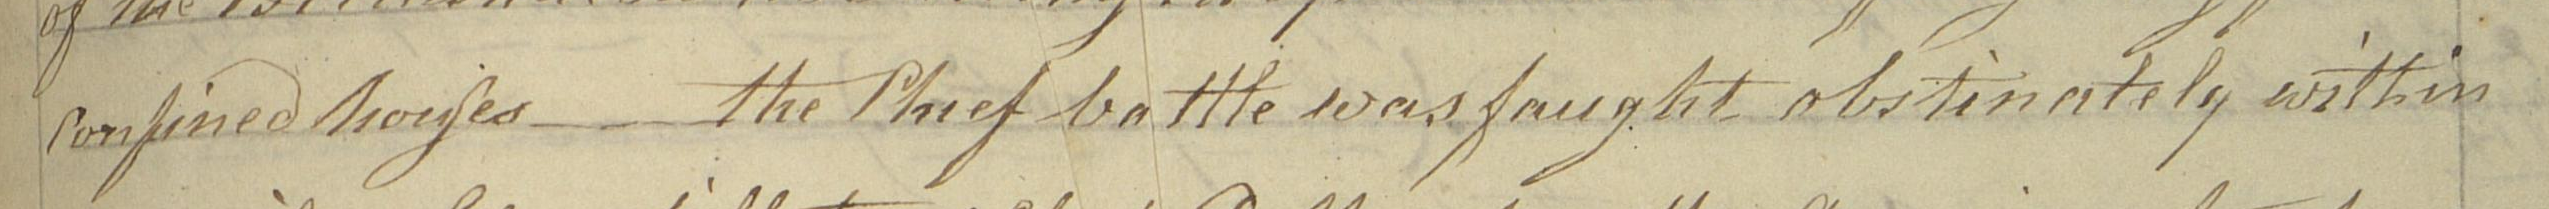confined houses the Chief battle was faught obstinaitely within
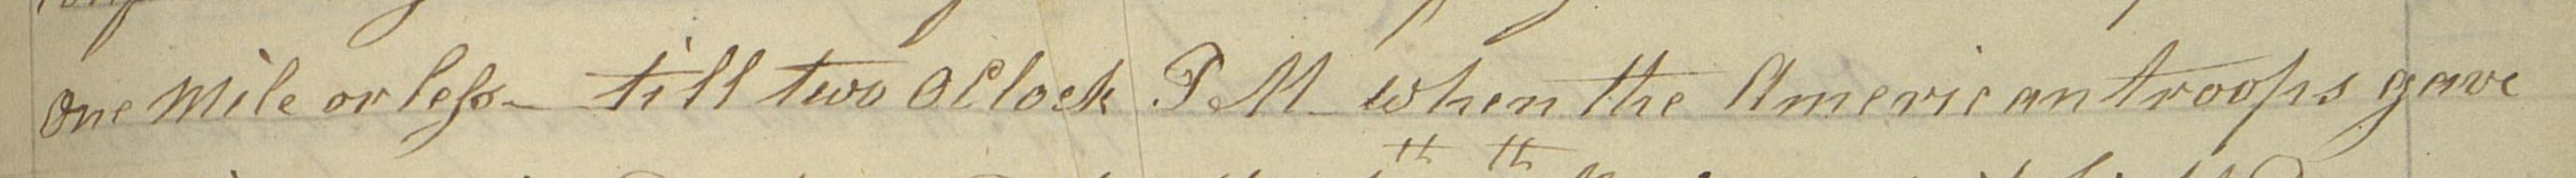One Mile or less, till two OClock PM when the American troops gave
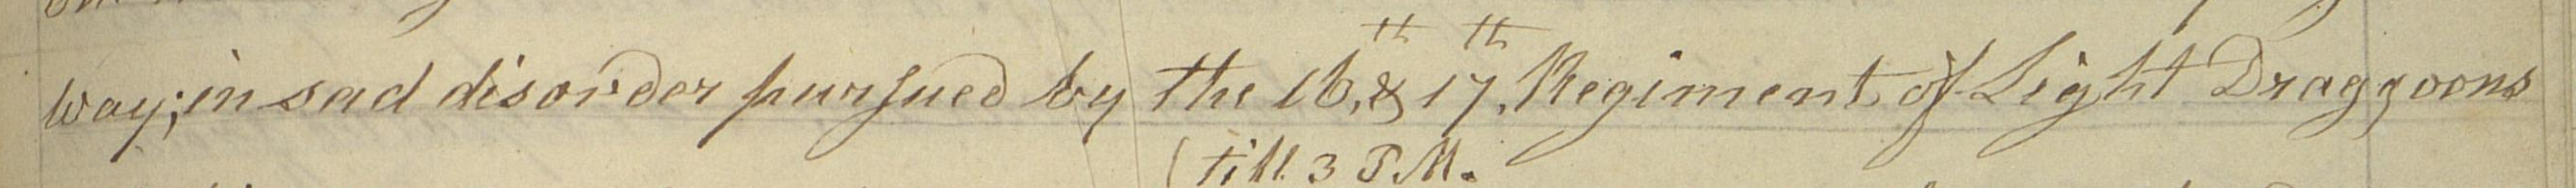way; in sad disorder pursued by the 16^th & 17^th Regiment of Light Draggoons
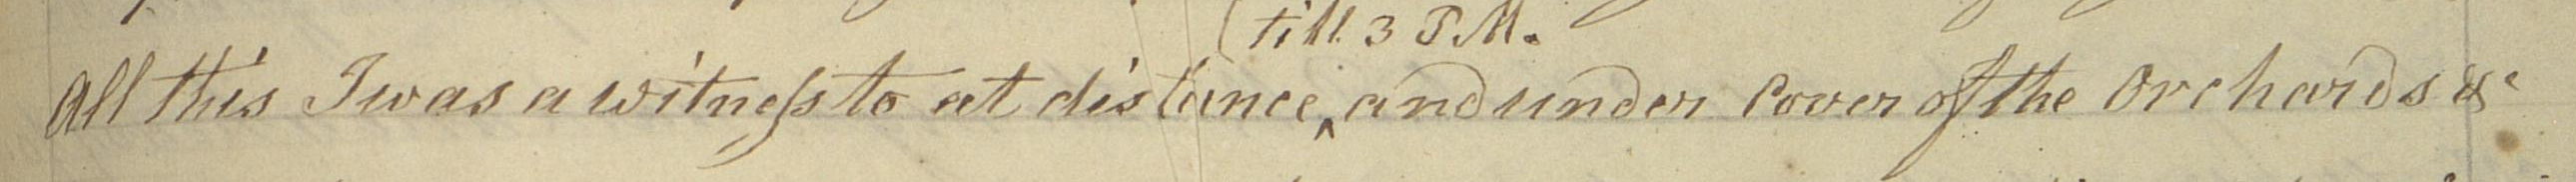All this I was a witness to at distance ^ and under cover of the Orchards &c
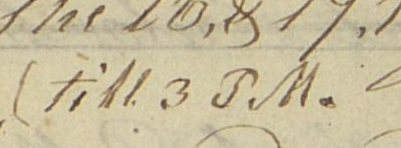till 3 PM.
